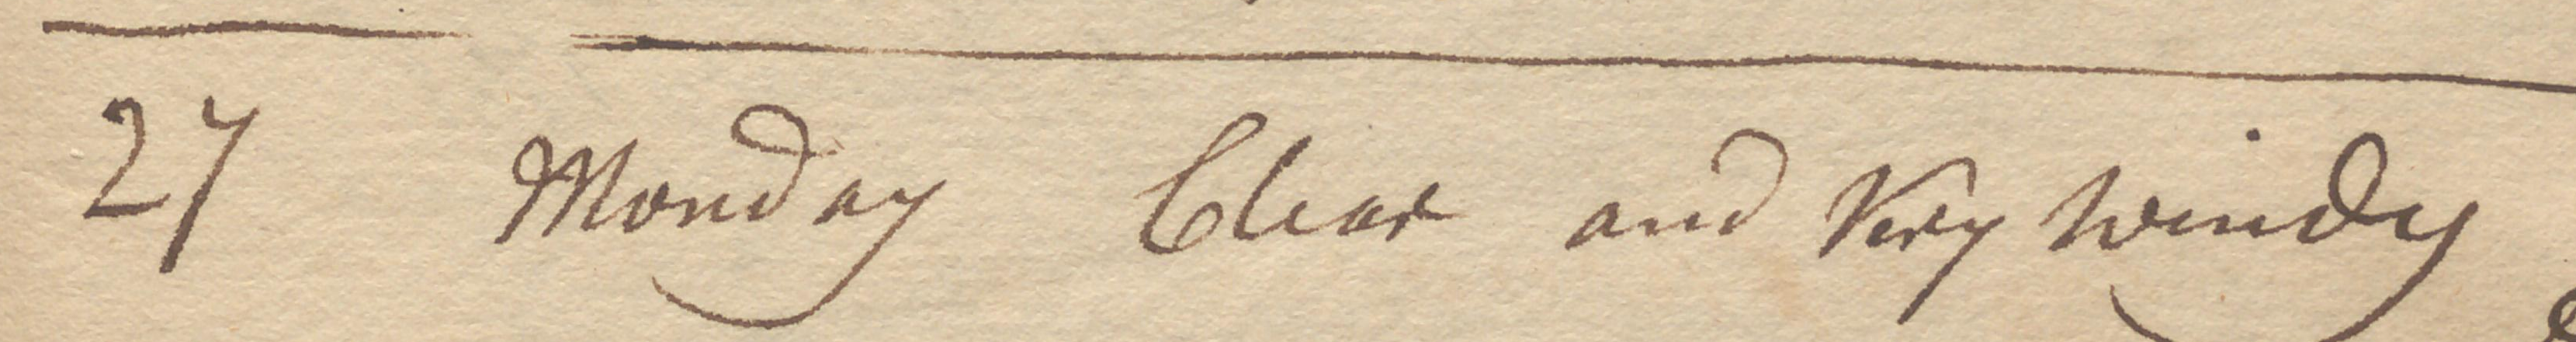27 Monday Clear and very windy
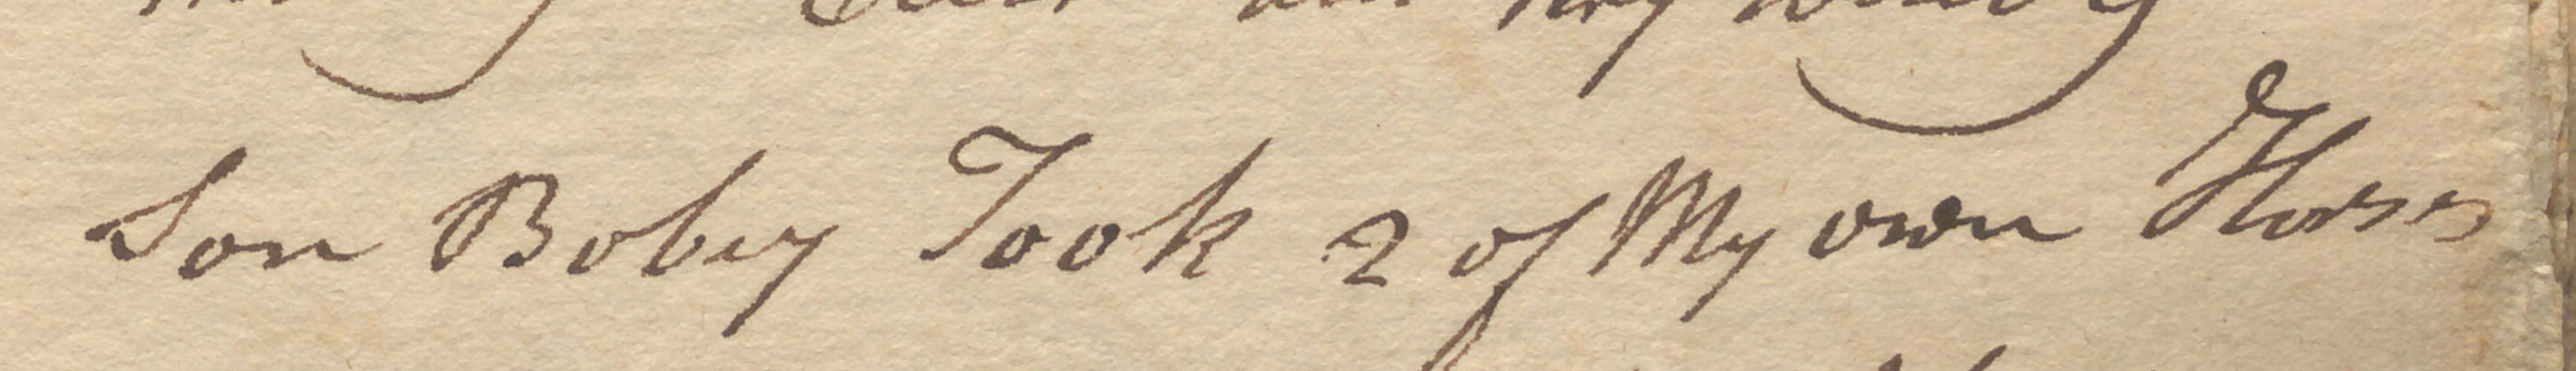Son Bobey Took 2 of My own Horses
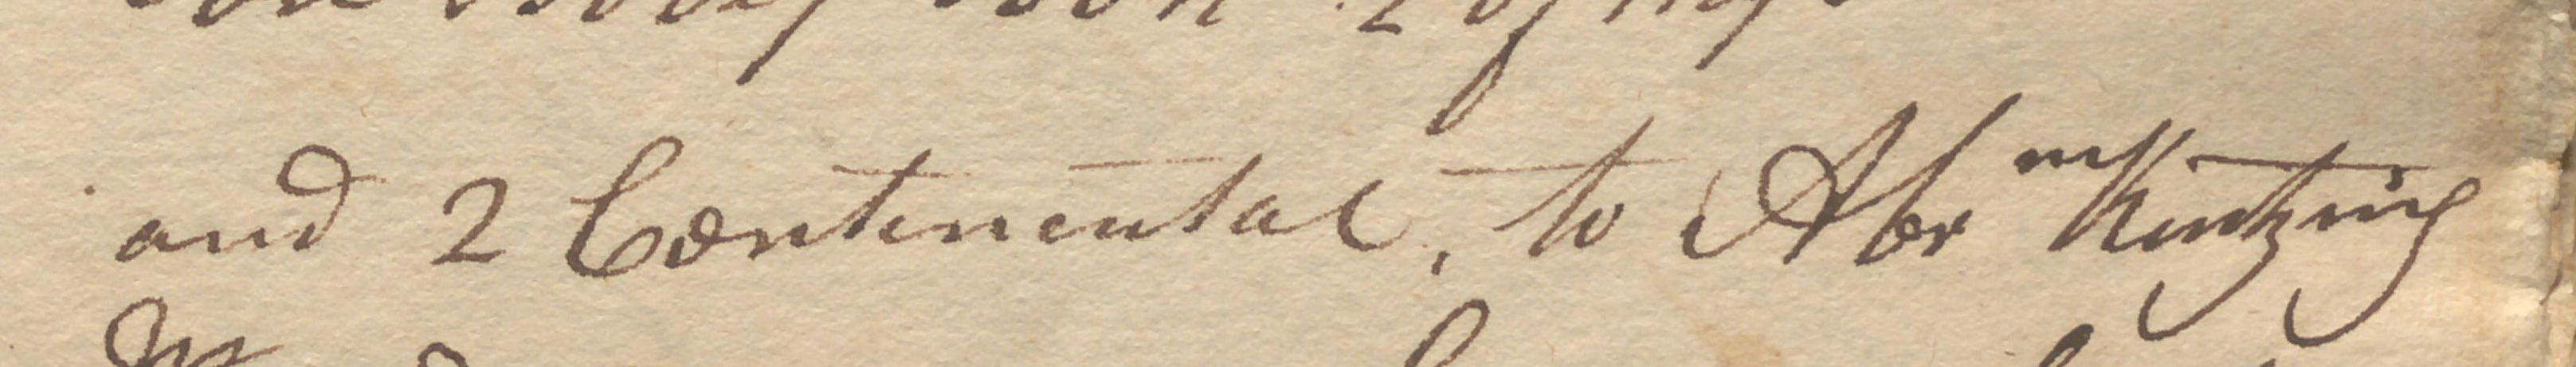and 2 Continental, to Abr^m Kintzing
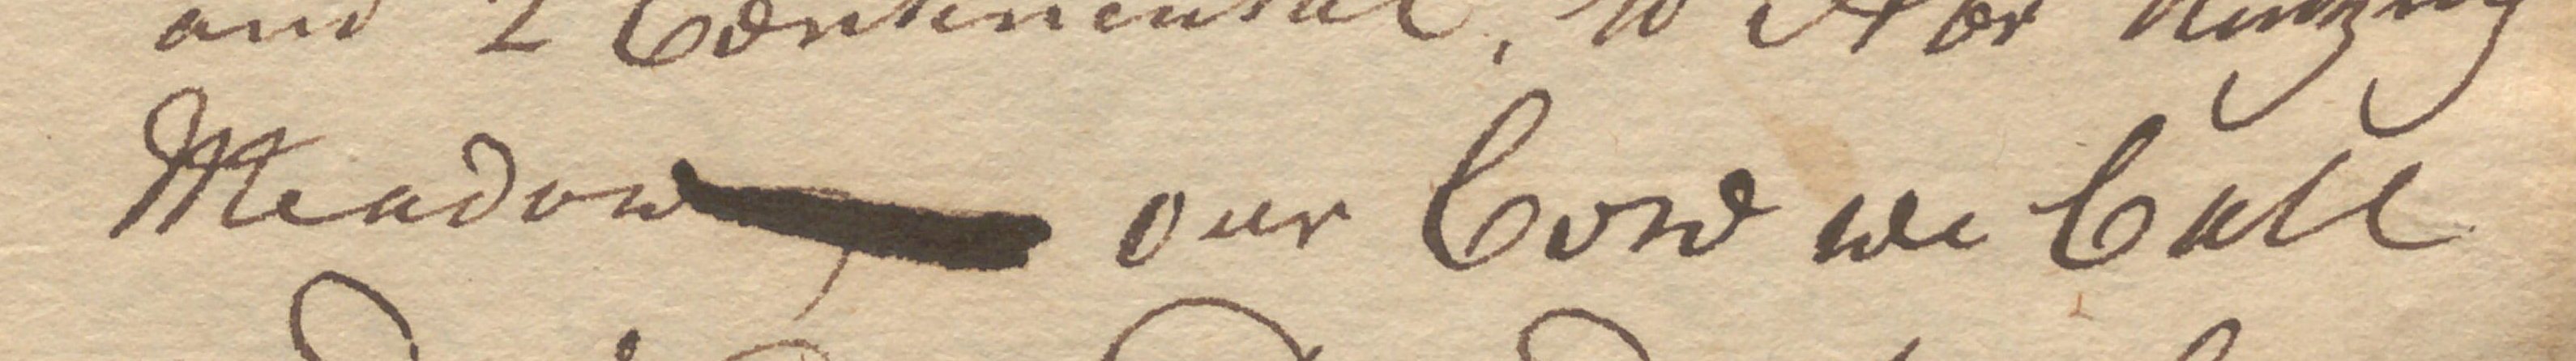Meadow[___] our Cow we Call
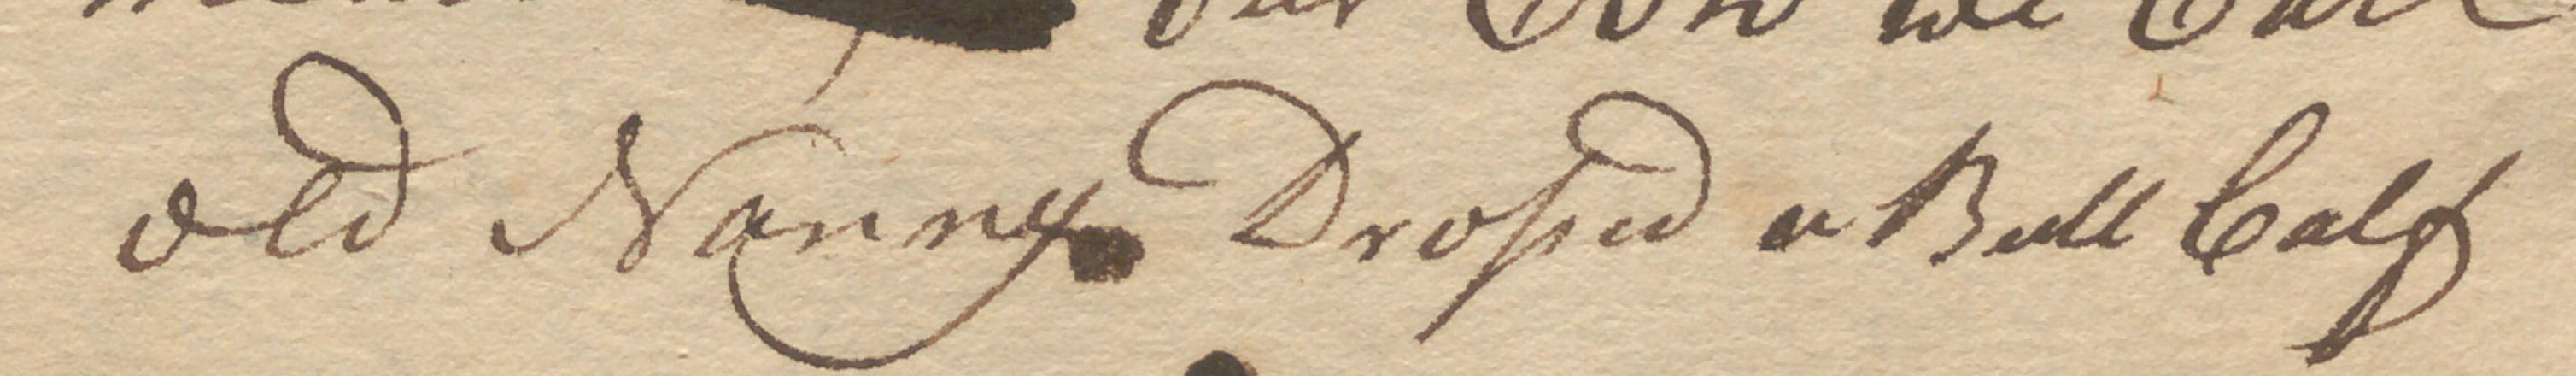old Nanny Droped a Bull Calf
